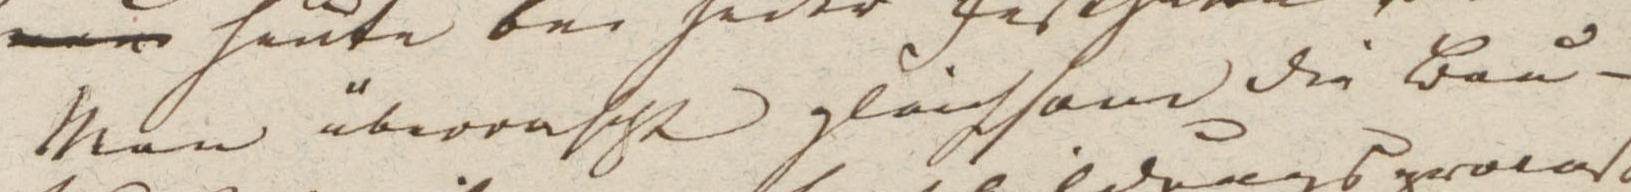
Man überrascht gleichsam die Bau-
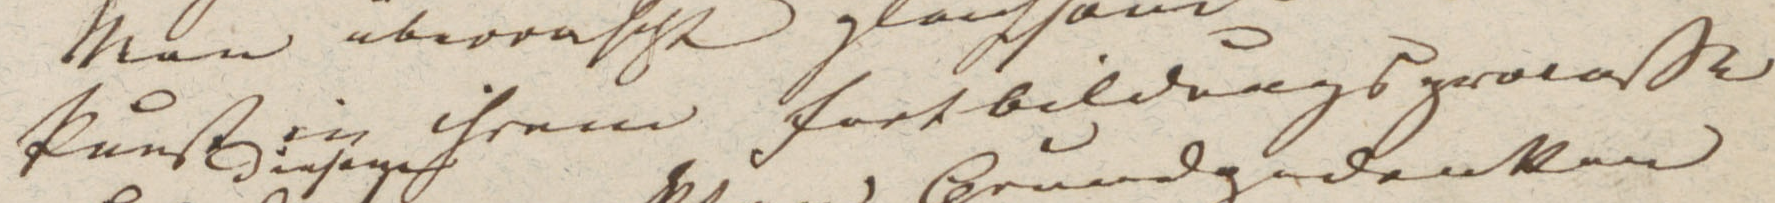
kunst in ihrem Fortbildungsprocesse
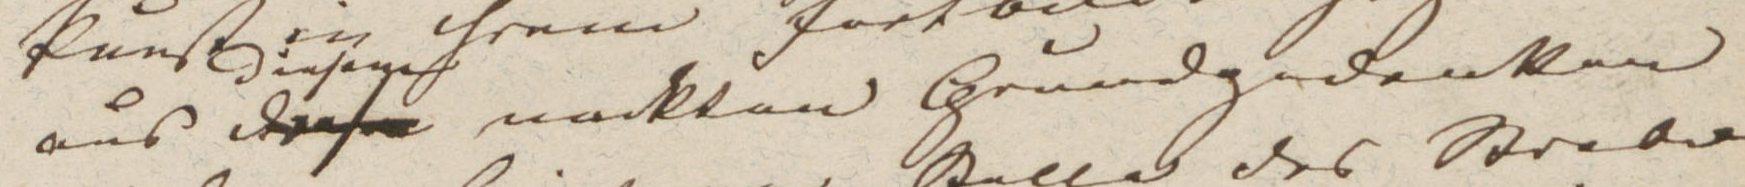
aus dies diesem nackten Grundgedanken
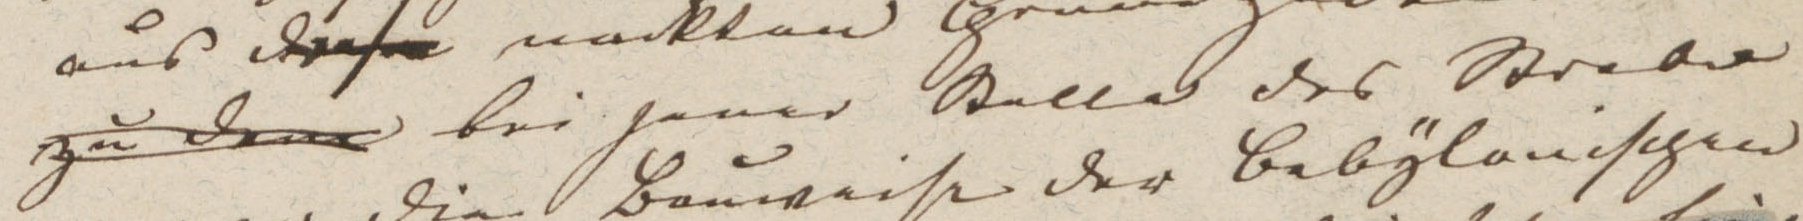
zu dem bei jener Stelle des Strabo
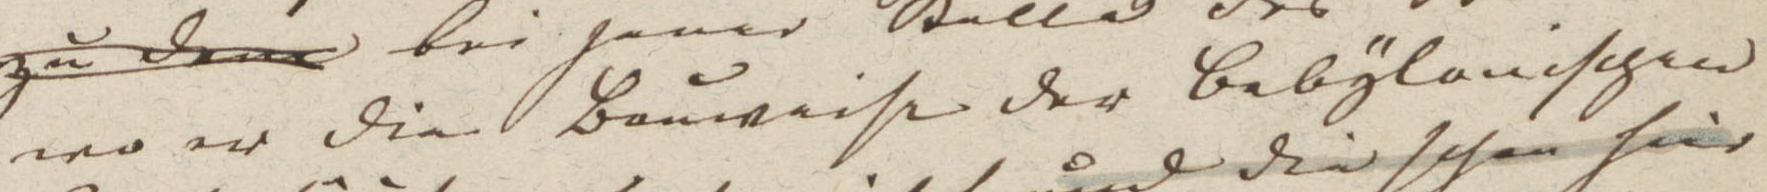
wo er die Bauweise der babylonischen
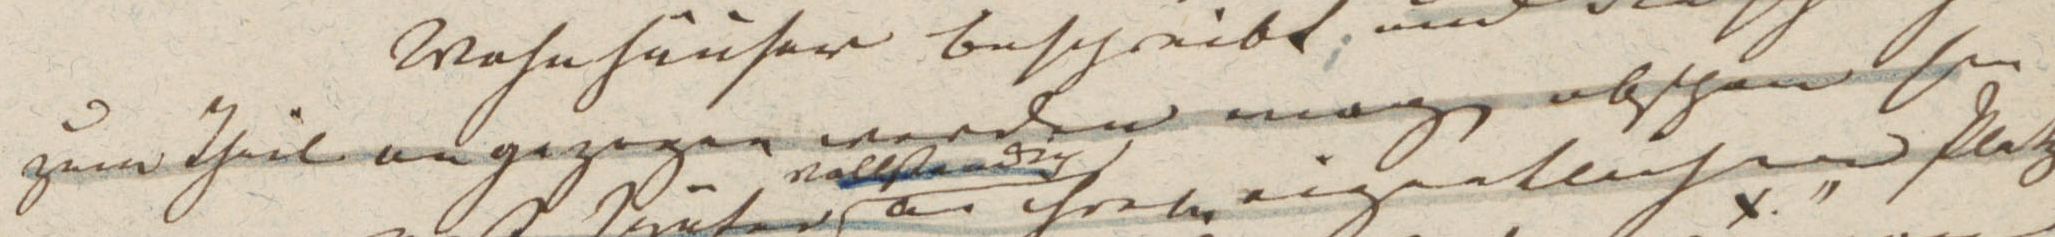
zum Theil angezogen werden mag obschon sie
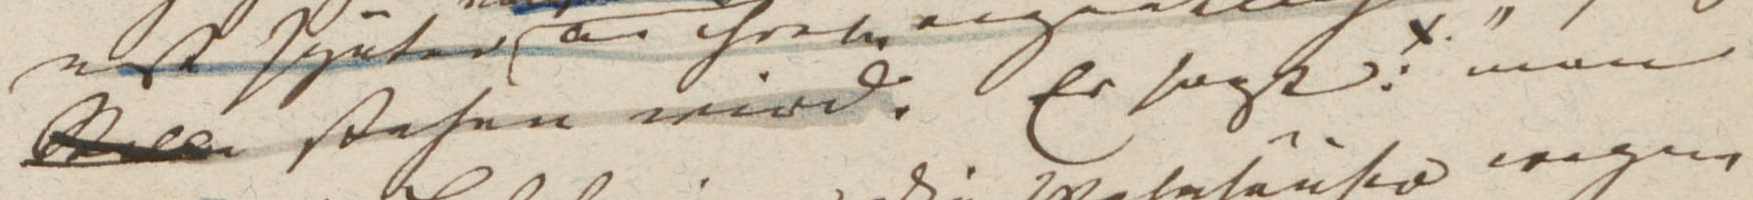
Stelle stehen wird. Er sagt: % "man
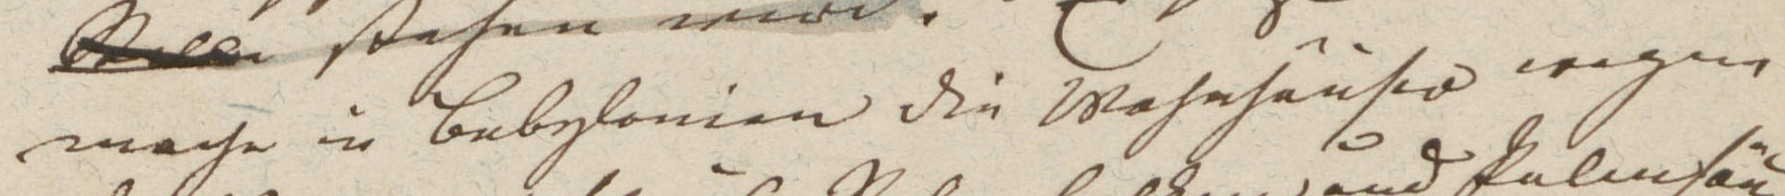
mache in Babylonien die Wohnhäuser wegen
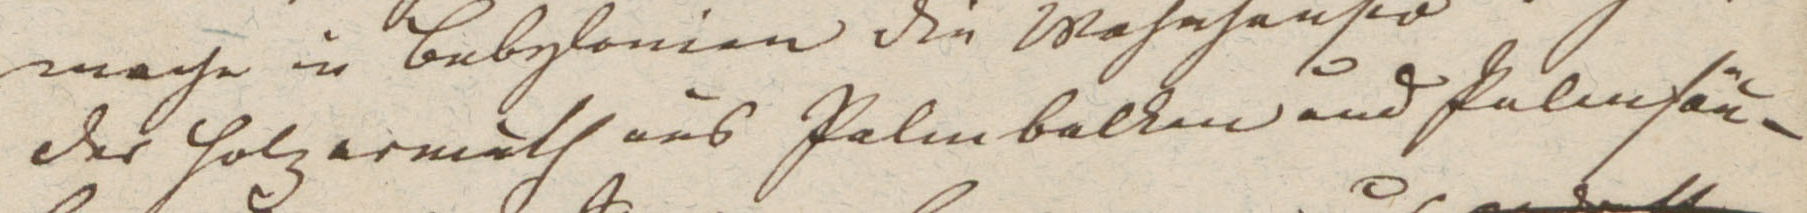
der Holzarmuth aus Palmbalken und Palmsäu-
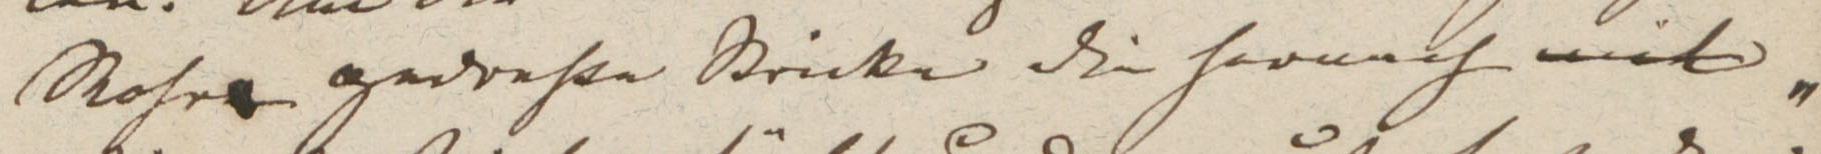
Rohre gedrehte Stricke die hernach mit
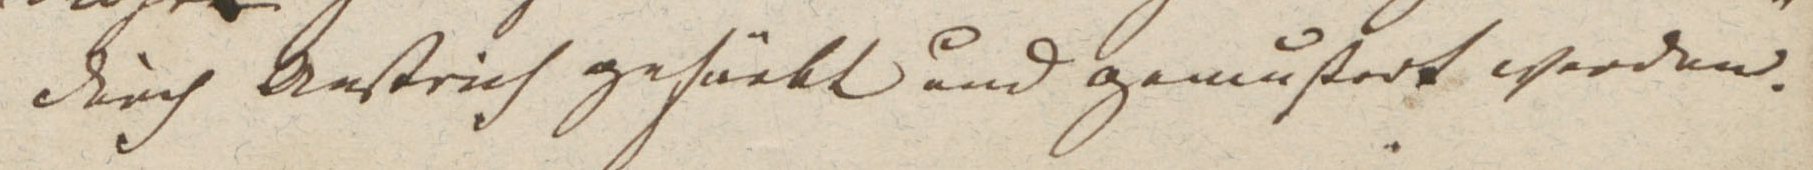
durch Anstrich gefärbt und gemustert werden."
